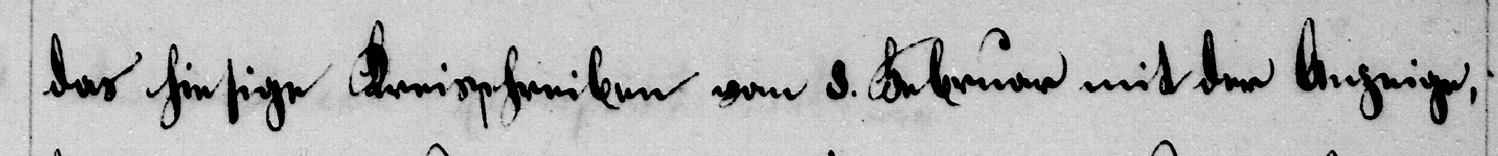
das hiesige Kreisschreiben vom 8. Februar mit der Anzeige,
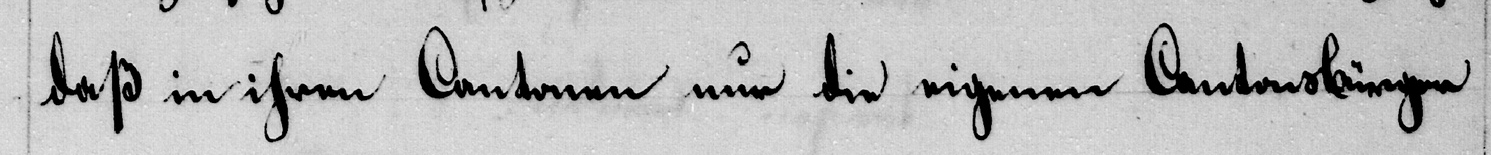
daß in ihren Cantonen nur die eigenen Cantonsbürger
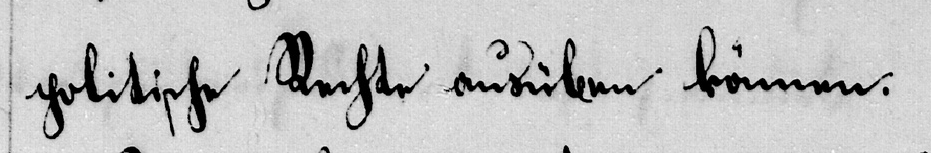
politische Rechte ausüben können.
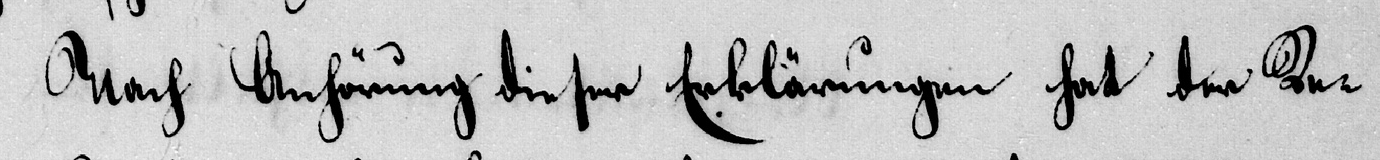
Nach Anhörung dieser Erklärungen hat der Re¬
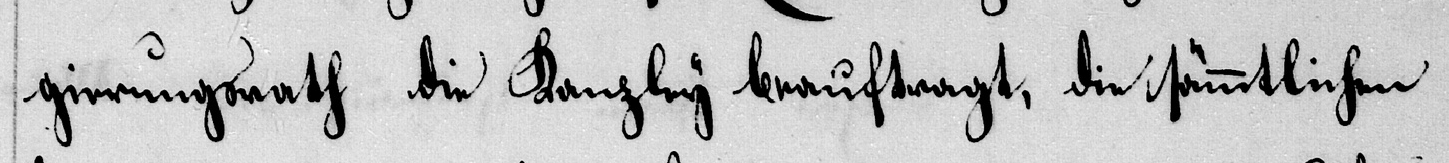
gierungsrath die Kanzley beauftragt, die sämmtlichen
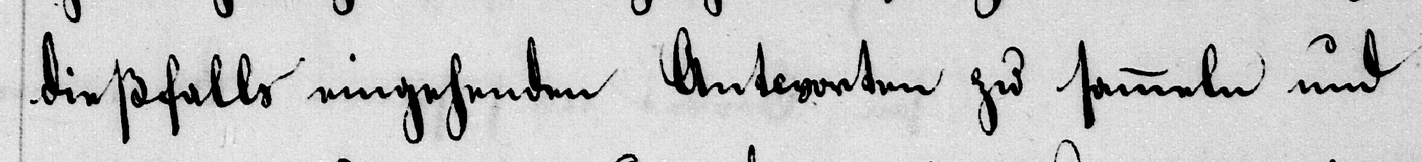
dießfalls eingehenden Antworten zu sammeln und
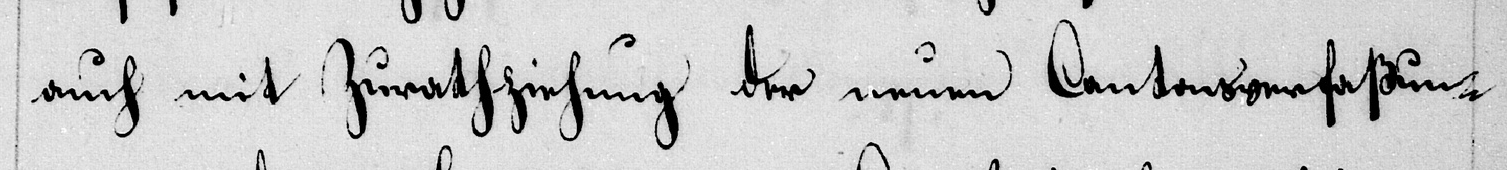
auch mit Zurathziehung der neuen Cantonsverfaßun¬
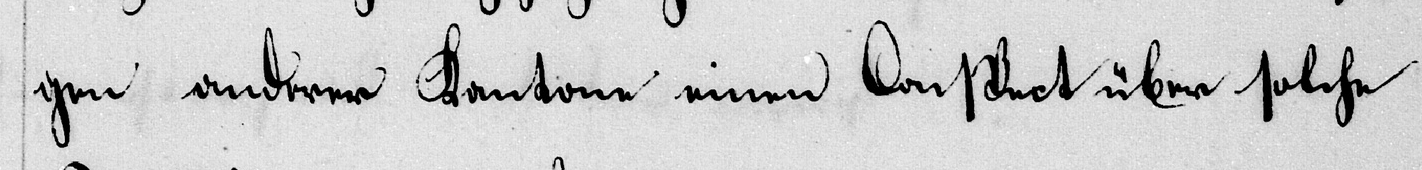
gen anderer Kantone einen Conspect über solche
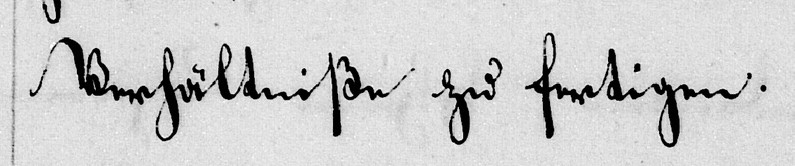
Verhältniße zu fertigen.
